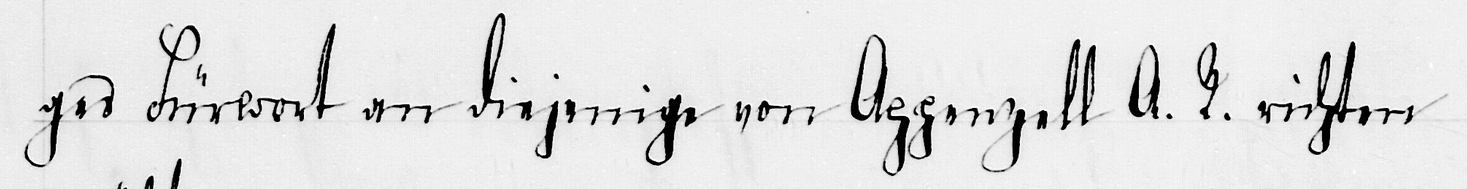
ges Fürwort an diejenige von Appenzell A. R. richten
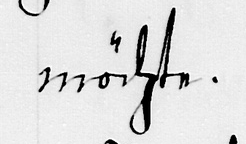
möchte.
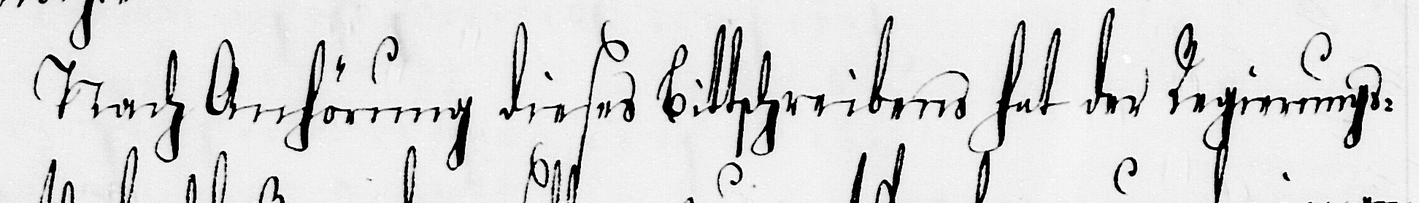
Nach Anhörung dieses Bittschreibens
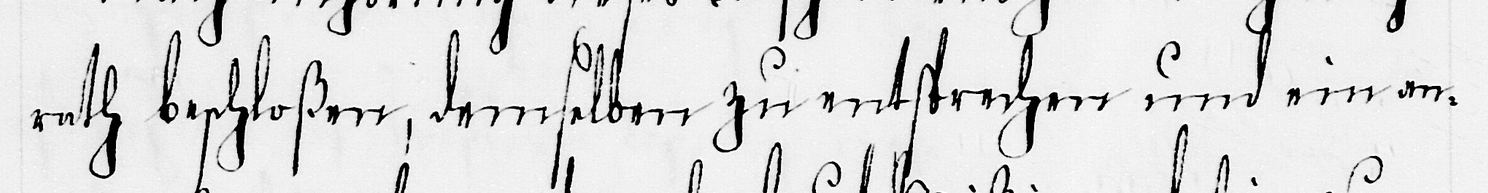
rath beschloßen, demselben zu entsprechen und ein an¬
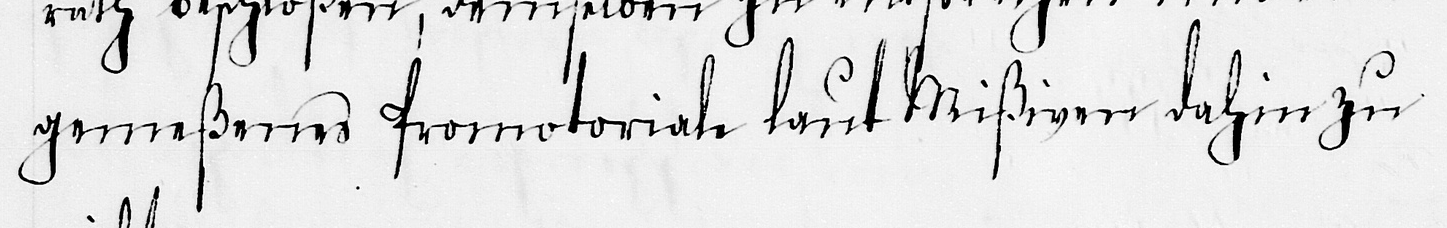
gemeßenes Promotoriale laut Mißivien dahin zu
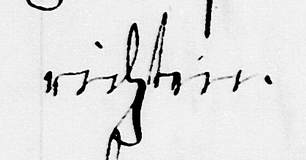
richten.
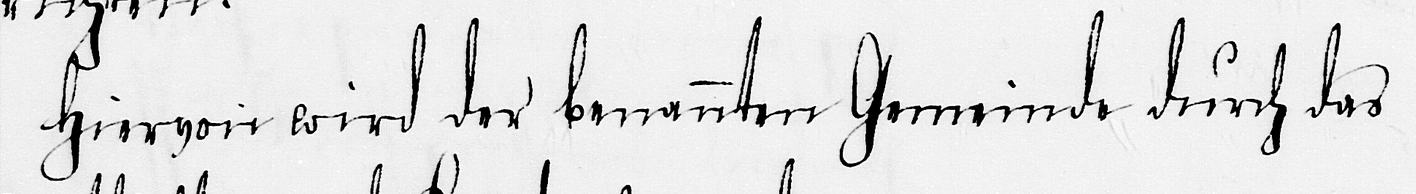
Hiervon wird der benannten Gemeinde durch das
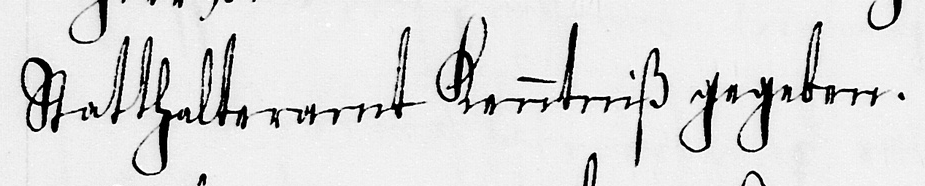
Statthalteramt Kenntniß gegeben.
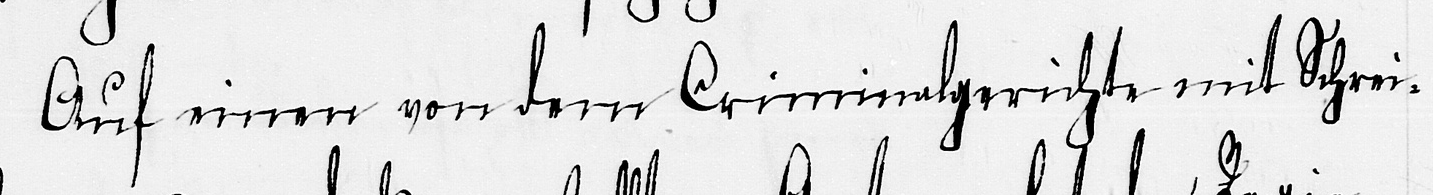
Auf einen von dem Criminalgerichte mit Schrei¬
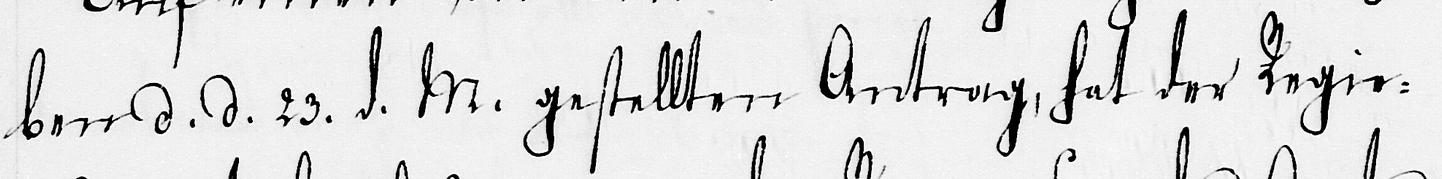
ben d. d. 23. d. M. gestellten Antrag, hat der Regie¬
